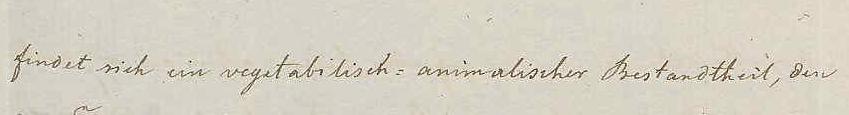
findet sich ein vegetabilisch-animalischer Bestandtheil, den
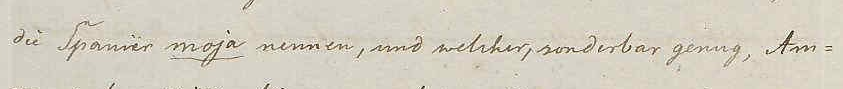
die Spanier moja nennen, und welcher, sonderbar genug, Am-
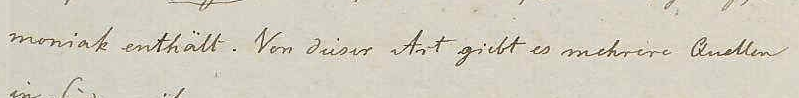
moniak enthält. Von dieser Art giebt es mehrere Quellen
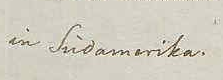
in Südamerika.
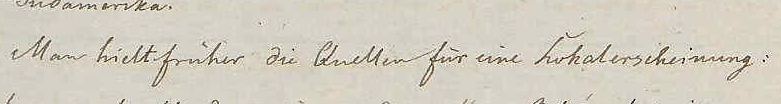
Man hielt früher die Quellen für eine Lokalerscheinung:
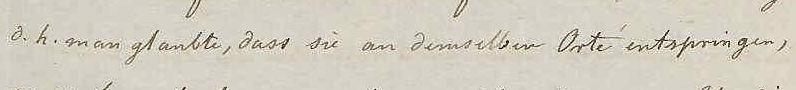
d. h. man glaubte, dass sie an demselben Orte entspringen,
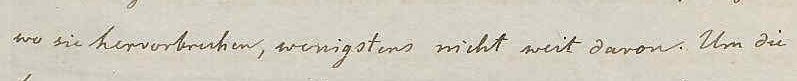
wo sie hervorbrechen, wenigstens nicht weit davon. Um die
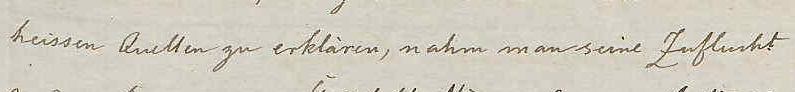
heissen Quellen zu erklären, nahm man seine Zuflucht
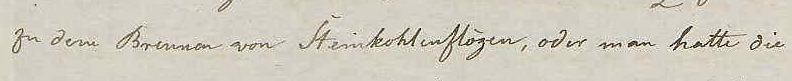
zu dem Brennen von Steinkohlenflözen, oder man hatte die
